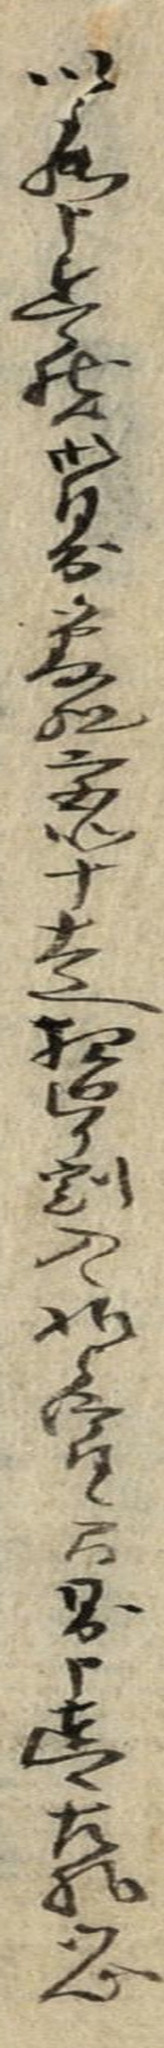以手紙申達候然は御自分御番組宮北十太夫夜廻り割入候様被仰付候間則申達候左様御心
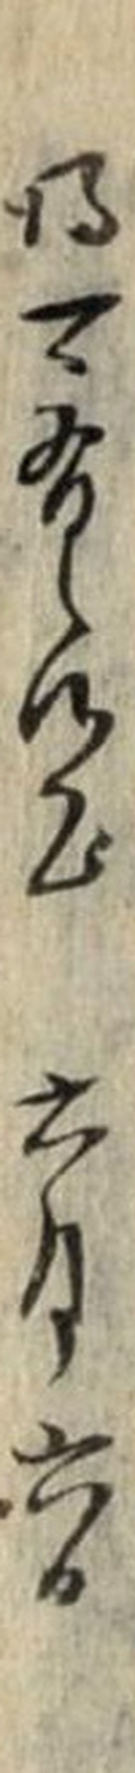得可有之候以上六月六日
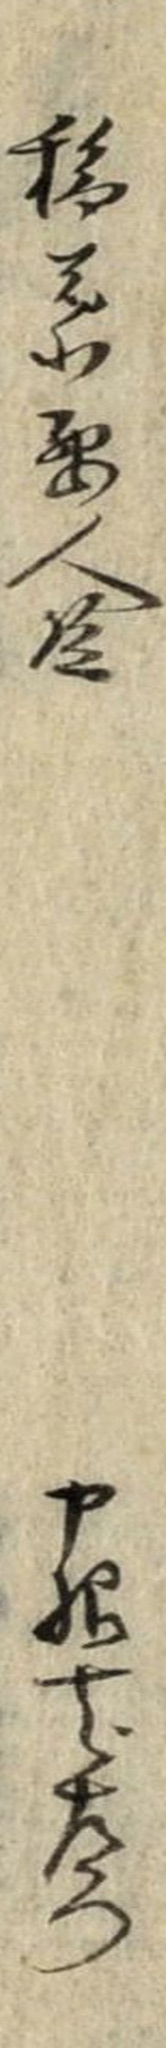稻葉要人殿中根十郎左衛門
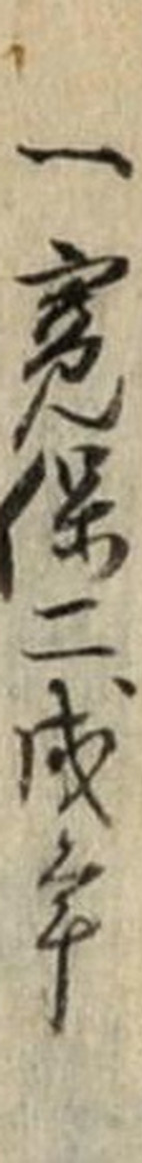一寛保二戌年
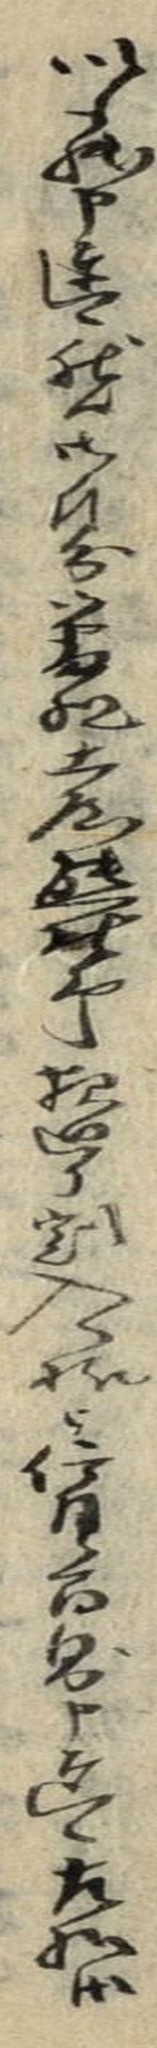以手紙申達候然は御自分御番組土屋熊次郎夜廻り割入候様被仰付候間則申達候左様御
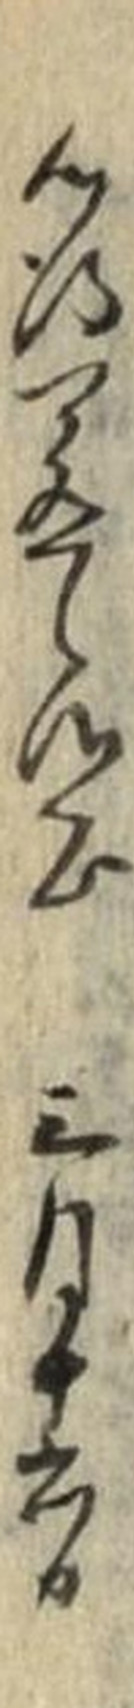心得可有之候以上三月十六日
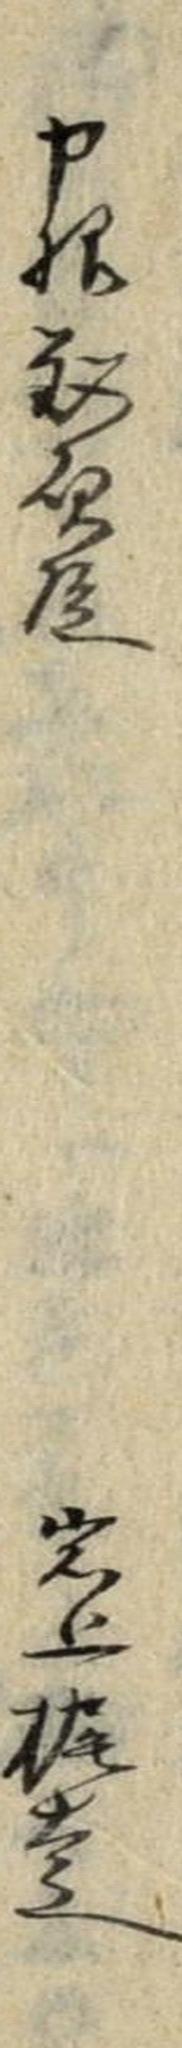中根靭負殿岩上梶太夫
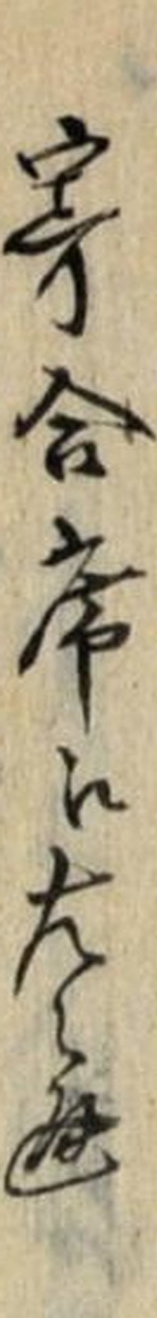寄合席江左之通
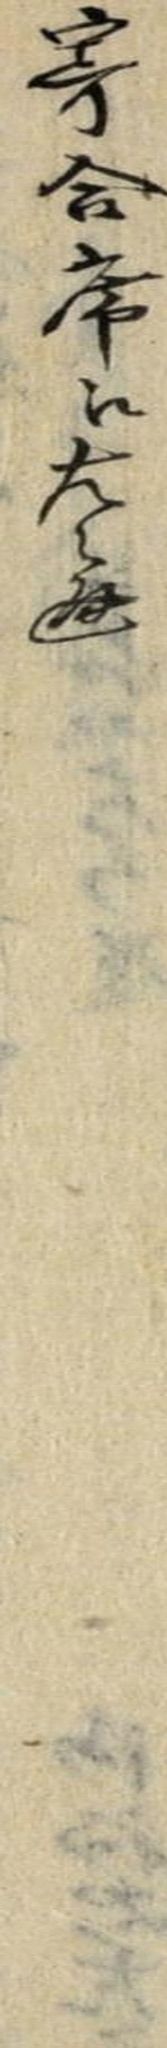寄合席江左之通
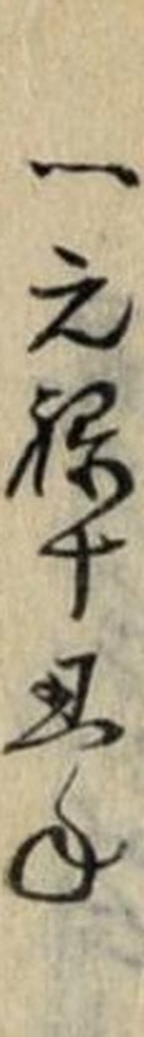一元禄十丑年
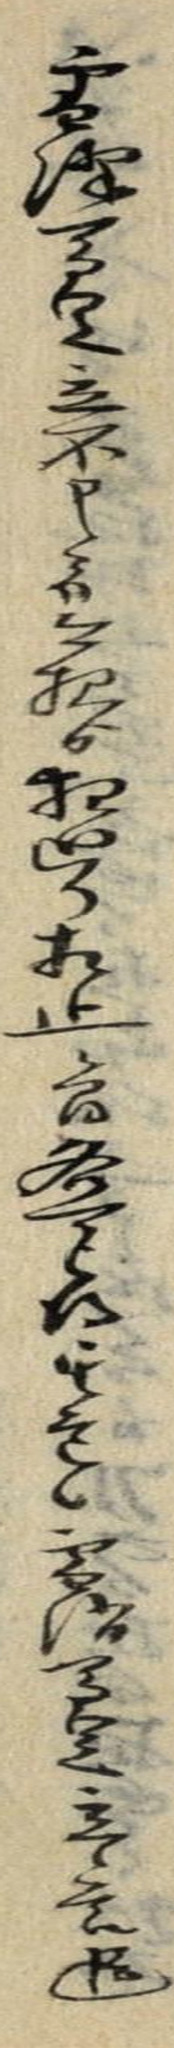雪深馬足立不申候に付今夜ゟ夜廻り相止候間各可被得其意候雪消馬足立候節追
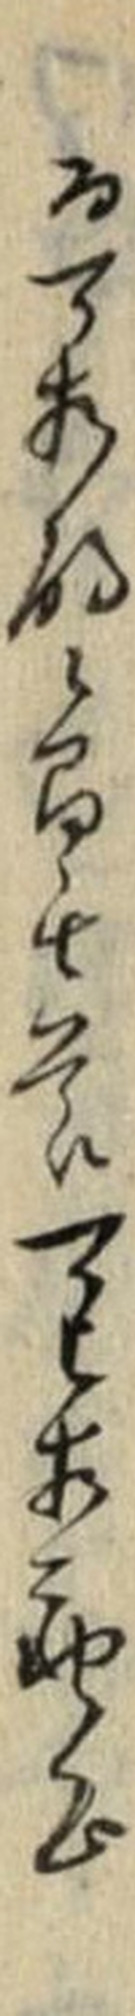而可相触候間其節可被相勤候以上
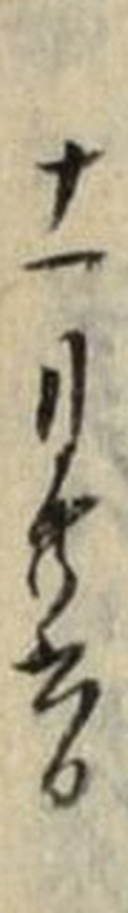十一月廿六日
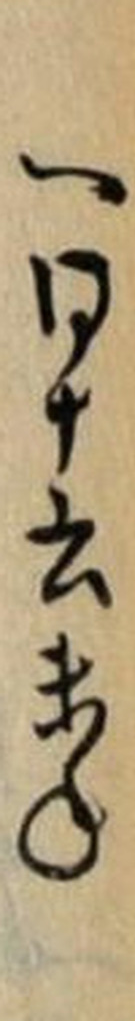一同十六未年
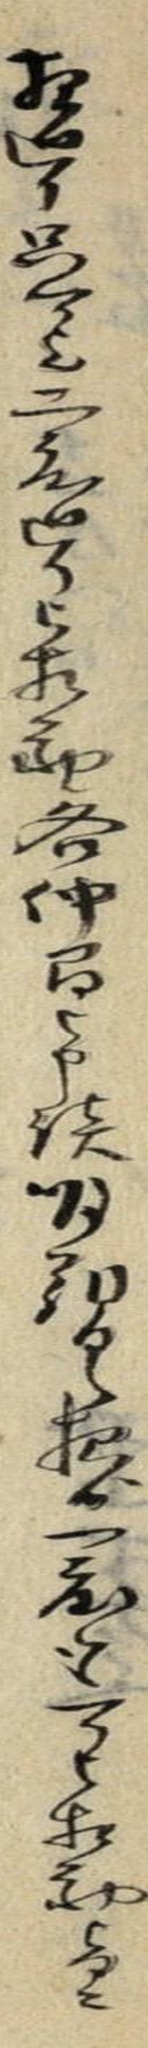夜廻り只今迄二度廻り被相勤各仲間被申談明朔日之夜ゟ一度つゝ可被相勤旨に
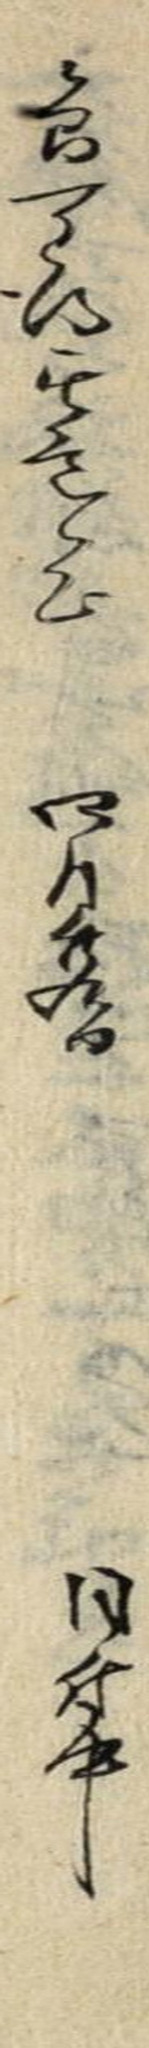候間可被得其意候以上四月廿九日
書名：蒐輯之部
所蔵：福井県文書館 Fukui Prefectural Archives
